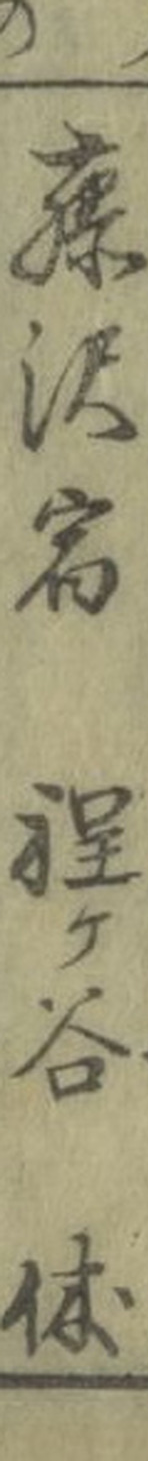藤沢宿程ケ谷休
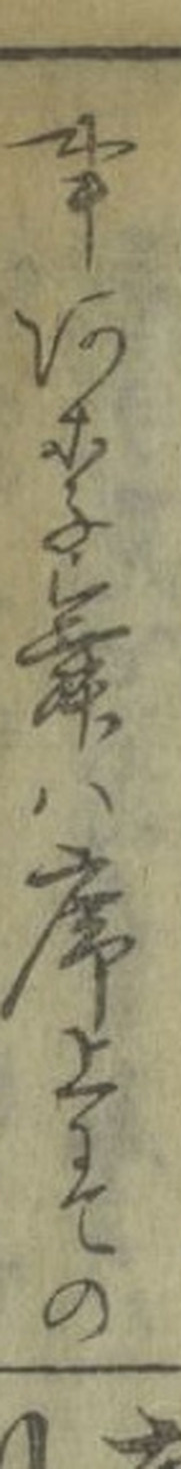事あり舞は席上にての
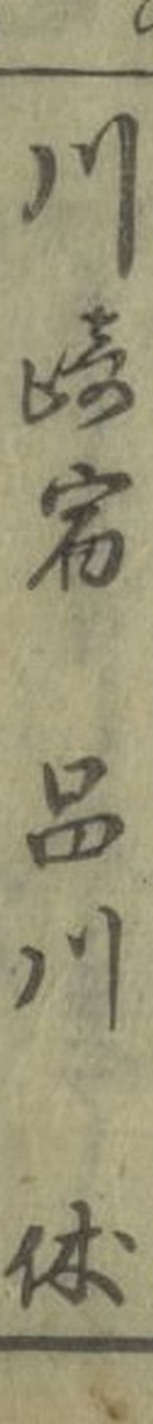川崎宿品川休
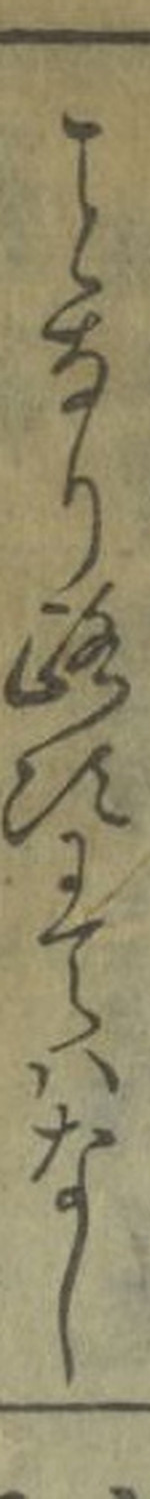ことなり路次にてはなし

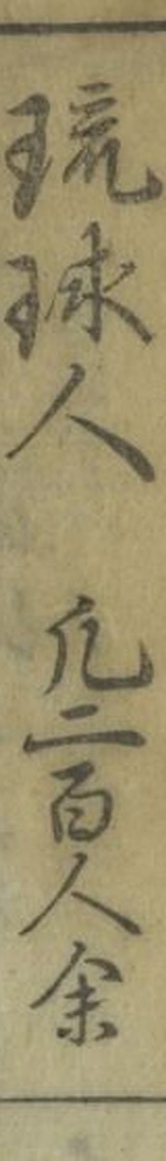琉球人凡二百人余
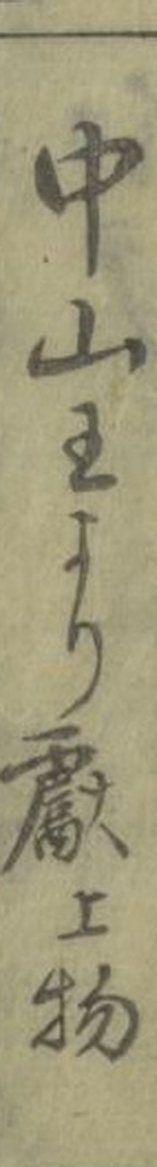中山王より献上物
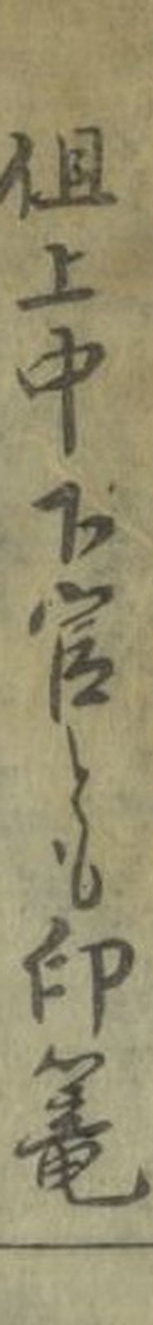但上中下官とも印篭
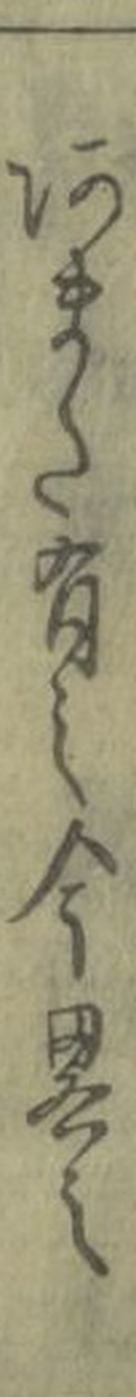あまた有之今略之
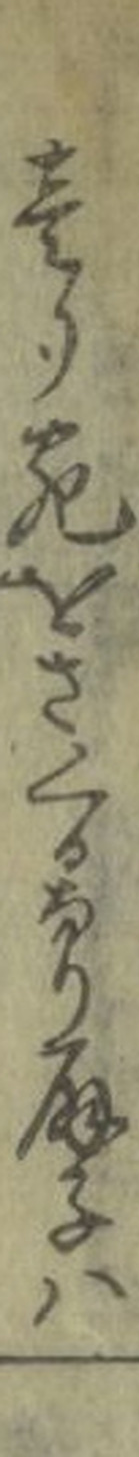壱つ宛をさくるなり扇子は
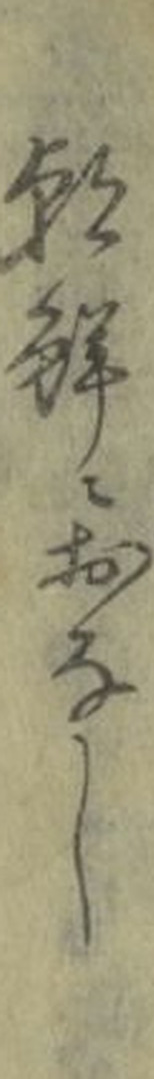朝鮮におなし
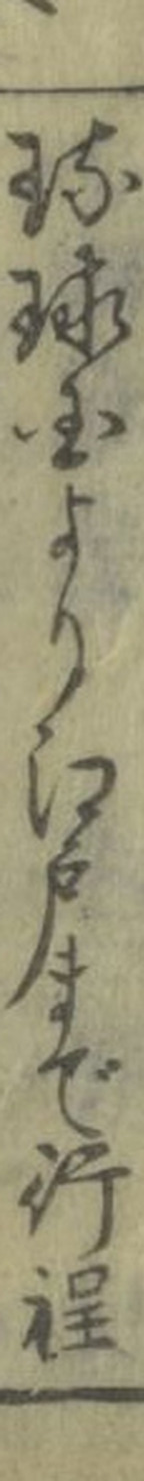琉球国より江戸まで行程
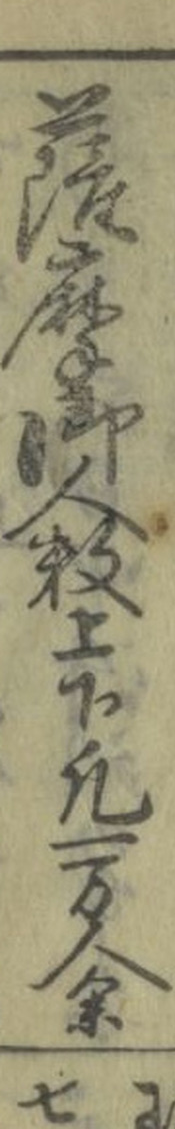薩摩御人数上下凡一万人余
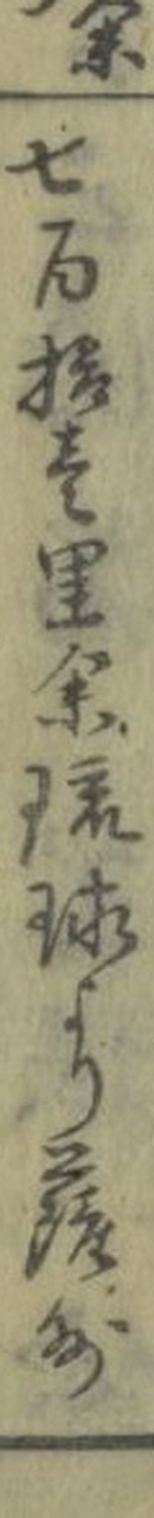七百拾壱里余琉球より薩州
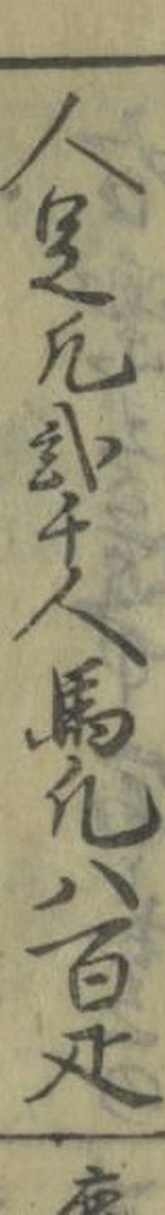人足凡弐千人馬凡八百疋
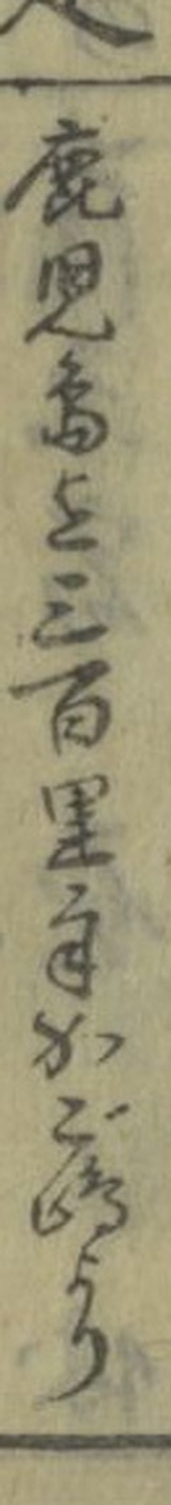鹿児島迄三百里余かご嶋より
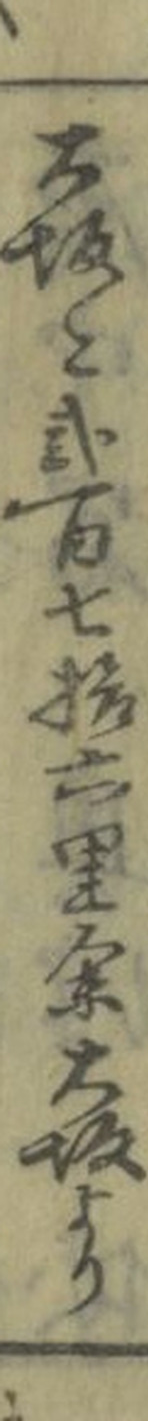大坂迄弐百七拾六里余大坂より
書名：琉球人行列記
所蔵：University of the Ryukyus Library
